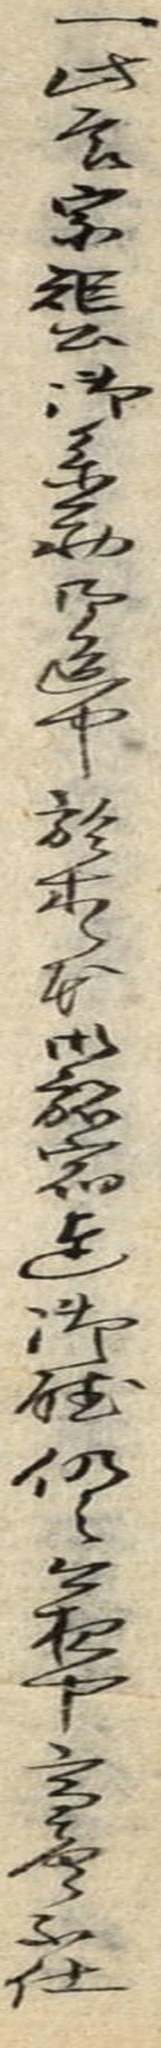一此節宗矩公御参勤御道中於木之本御旅宿達御聴仍之今夜中高声不仕
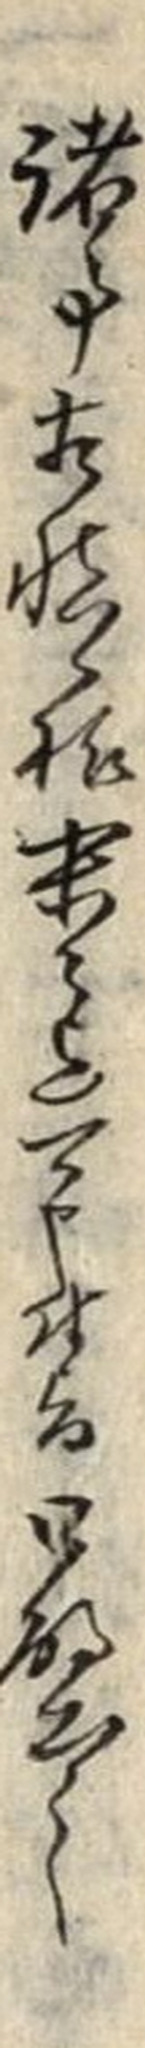諸事相慎候様末々迄可申付旨御触出之
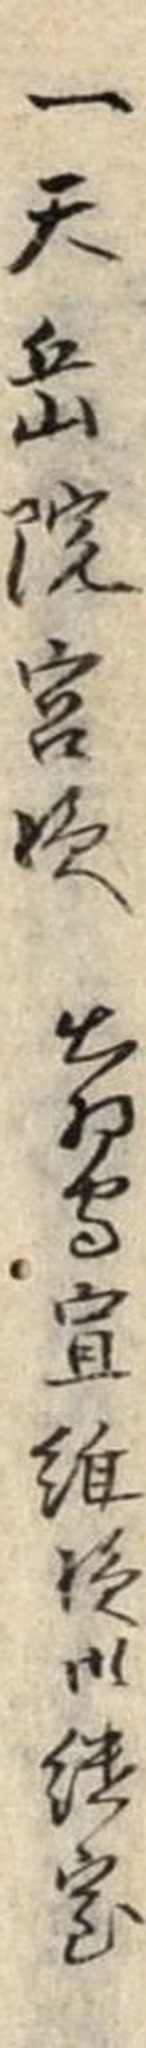一天岳院宮様出羽守宣維様御継室
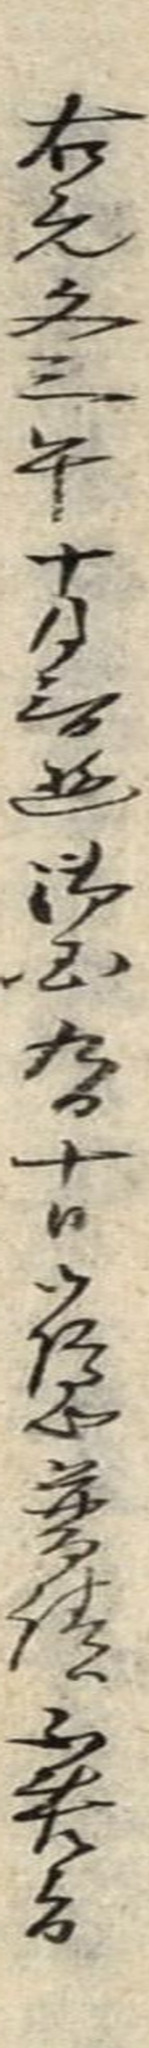右元文三午十月三日逝御国九日十日御停止普請は不苦旨
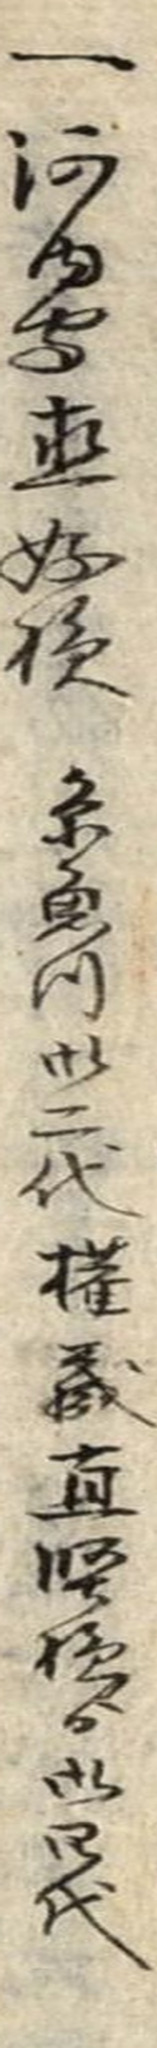一河内守直好様糸魚川御二代権蔵直堅様ゟ御四代
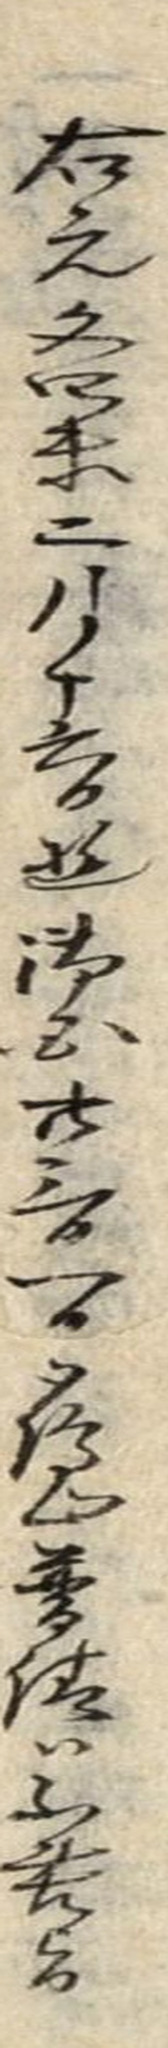右文久四未二月十六日逝御国廿三日一日御停止普請は不苦旨
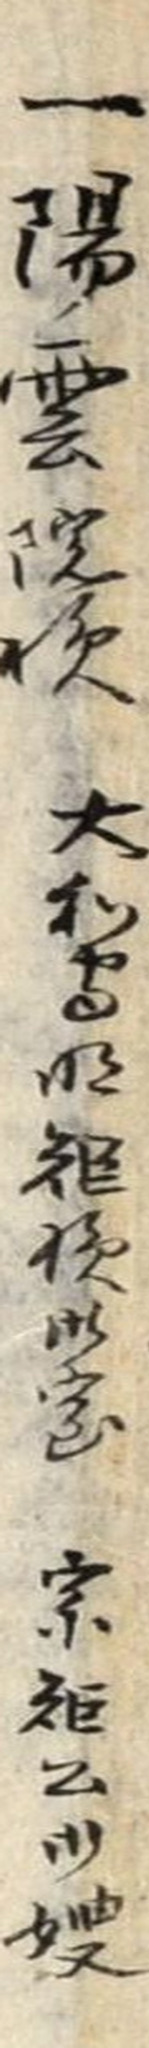一陽雲院様大和守明矩様御室宗矩公御嫂
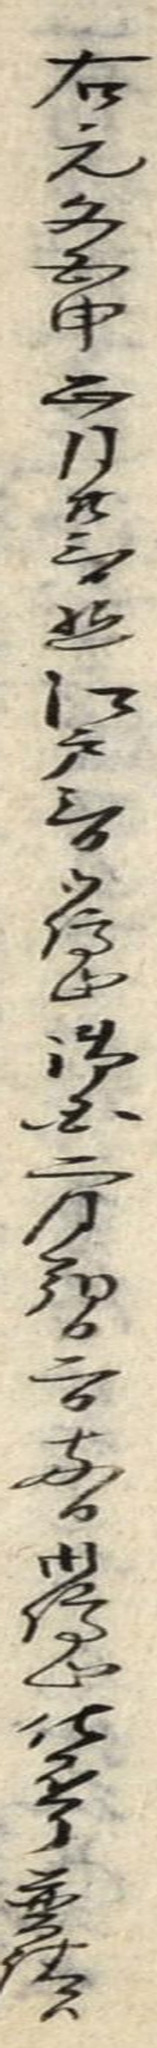右元文五申正月廿三日逝江戸三日御停止御国二月朔日二日両日御停止仕懸り普請は
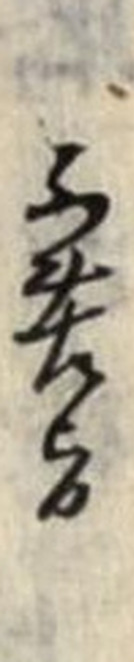不苦旨

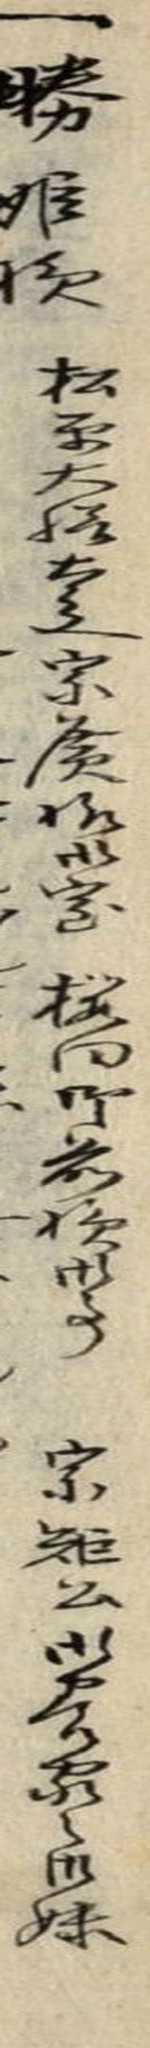一勝姫様松原大膳大夫宗広様御室桜田御前様御事宗矩公御養家之御妹
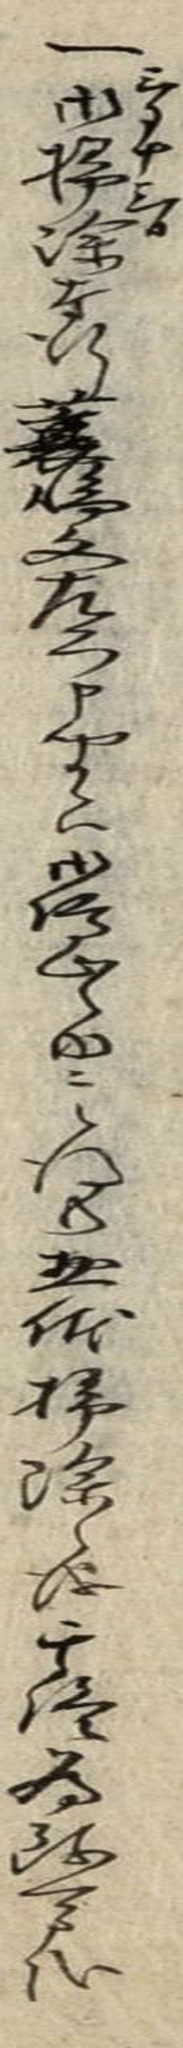一御掃除奉行蓑輪文左衛門申聞候は御停止之内に候得共惣体掃除之儀其儘為致可申哉
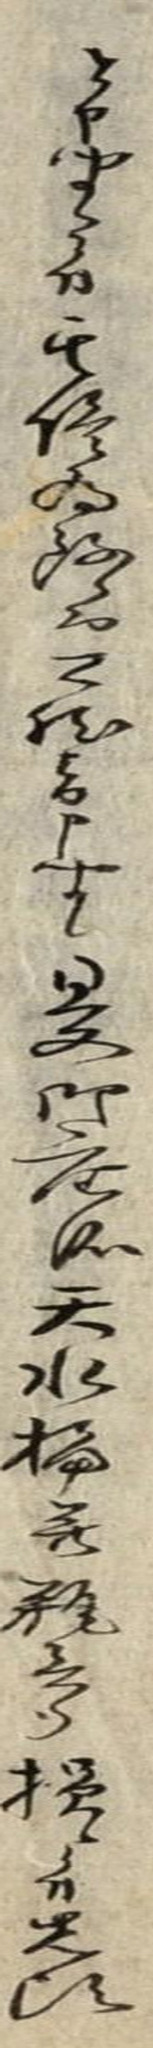と申聞候に付其儘為致候て可然旨申聞候且又御座所天水桶并瓶壱ツ損候に付先頃
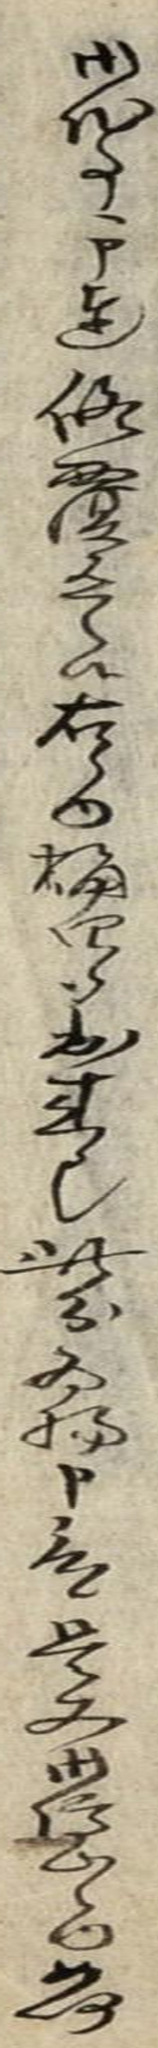御作事へ申達修覆有之候右之内桶四ツ出来申候此分為揚申度候是又御停止之内如何
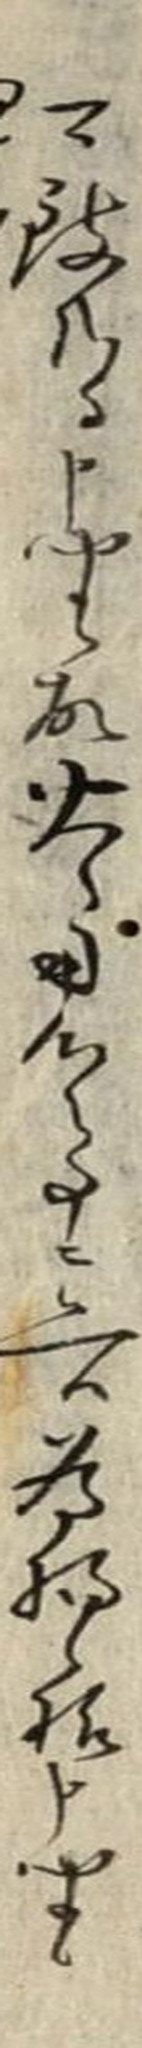可致哉と申聞候故火之用心之事に候へは為揚候様申聞候
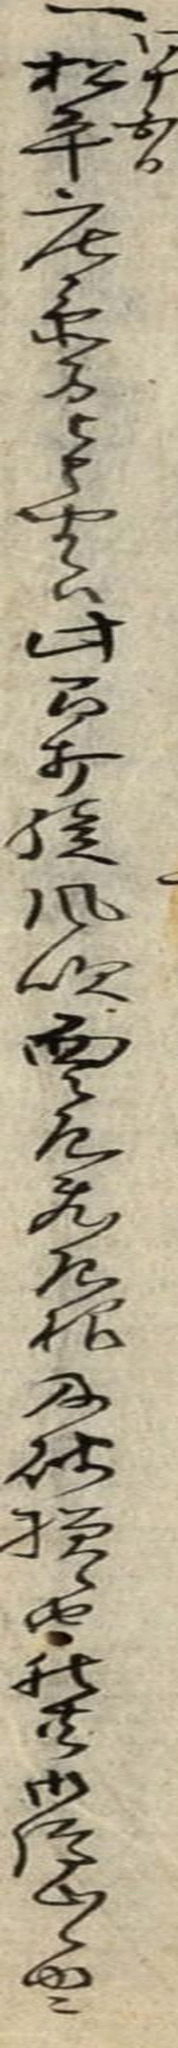一松平庄兵衛方被申聞候は此間打続風吹面々屋敷屋根及破損候由然共御停止之内に
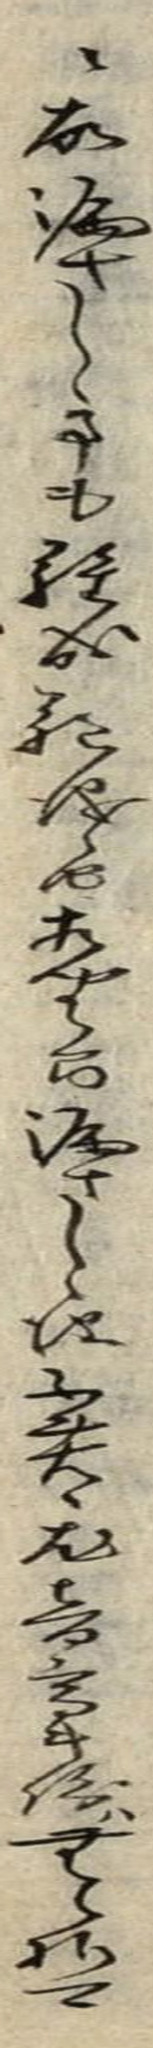候故漏さし候事も難成難儀之由相聞候間漏さし候儀不苦候故音高キ儀は無之様可
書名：御停止異変死失
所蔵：福井県文書館 Fukui Prefectural Archives
